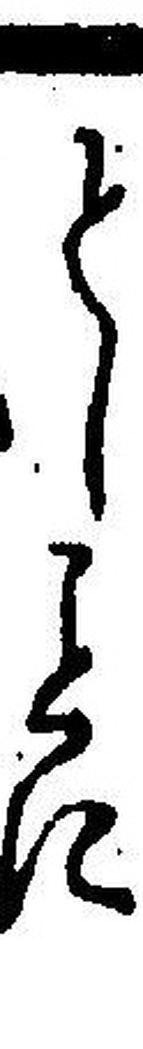としことに
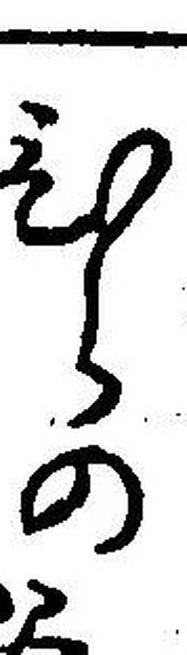ひらく
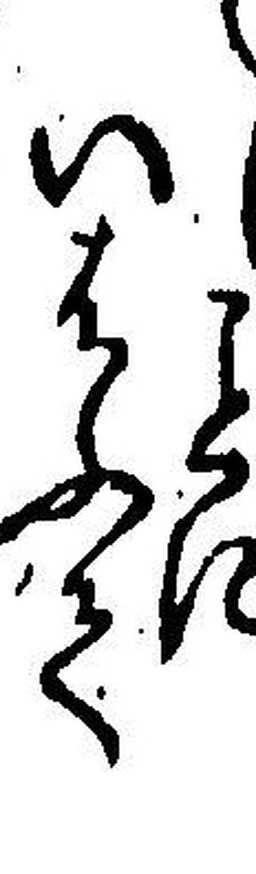いはふて
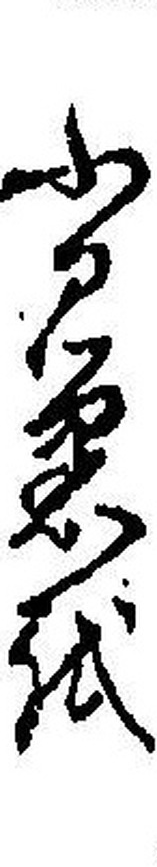ふる巣を
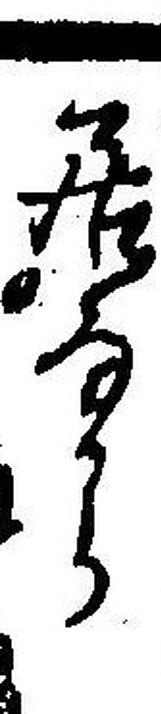居るから
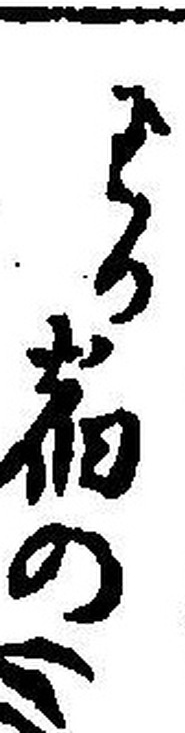わか宿の
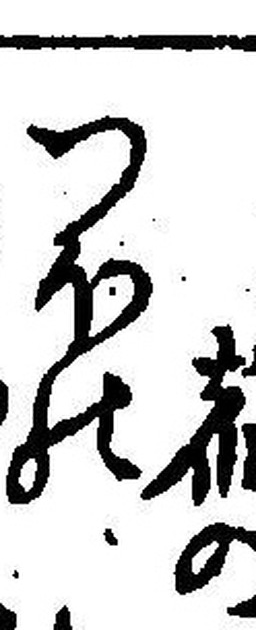つほの
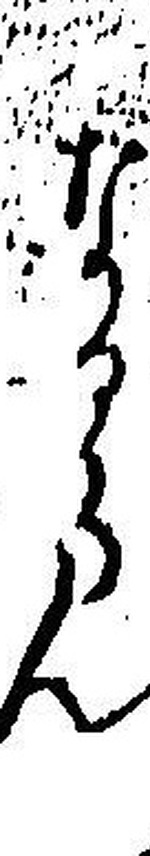なるらん
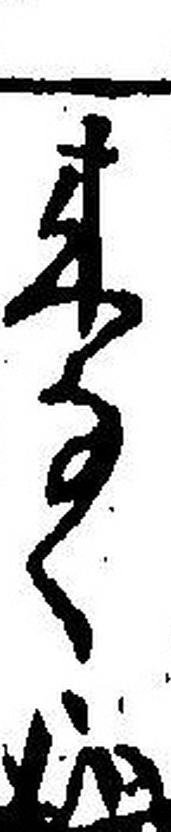来なく

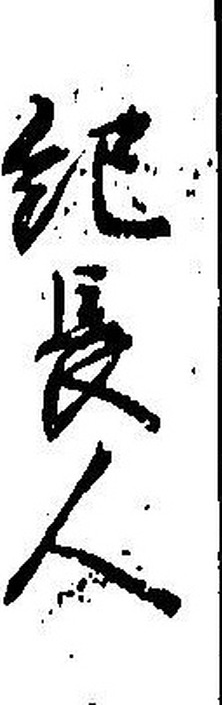紀長人
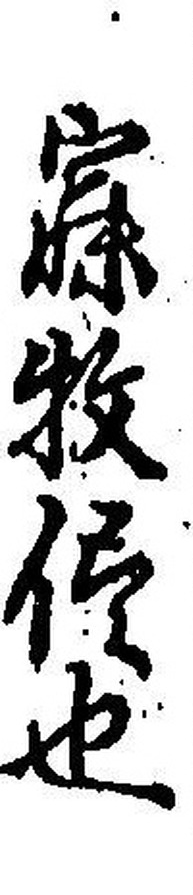寝牧侭也
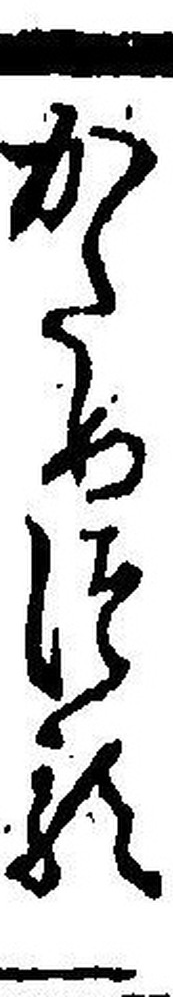かためつる
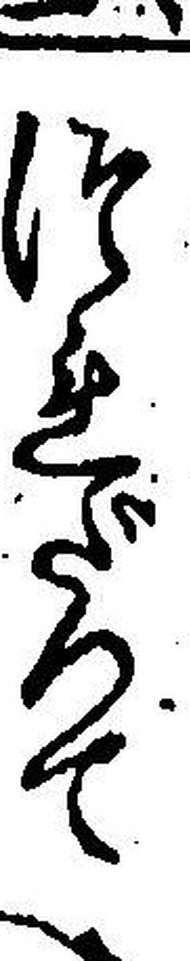つれだつて
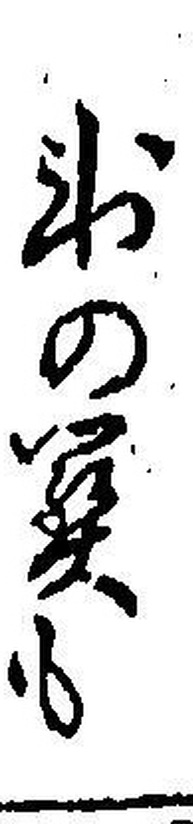氷の関も
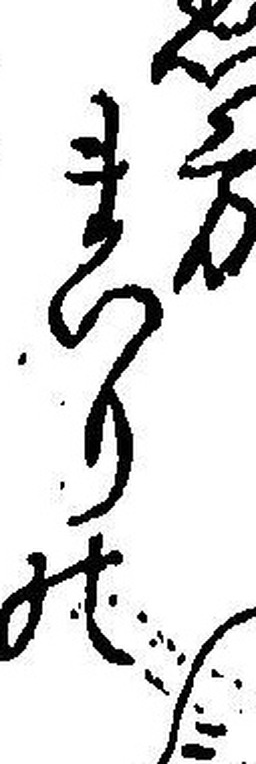まいりの
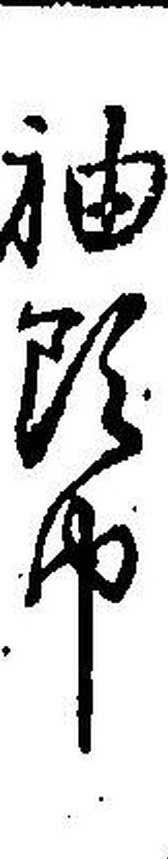袖頭巾
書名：どうれ百人一首 / 鹿都部真顔(狂歌堂)編
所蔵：東京大学総合図書館 General Library in the University of Tokyo, JAPAN
